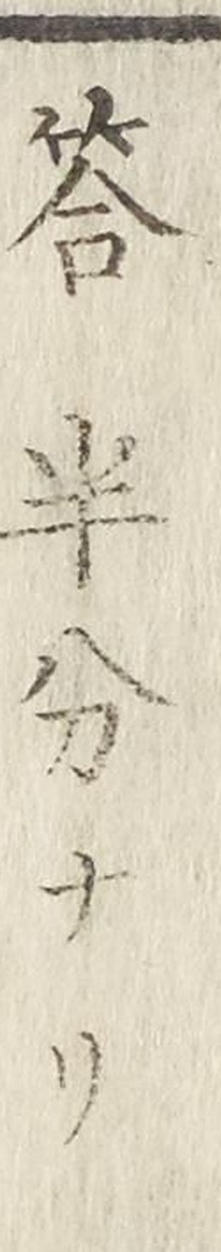答半分ナリ
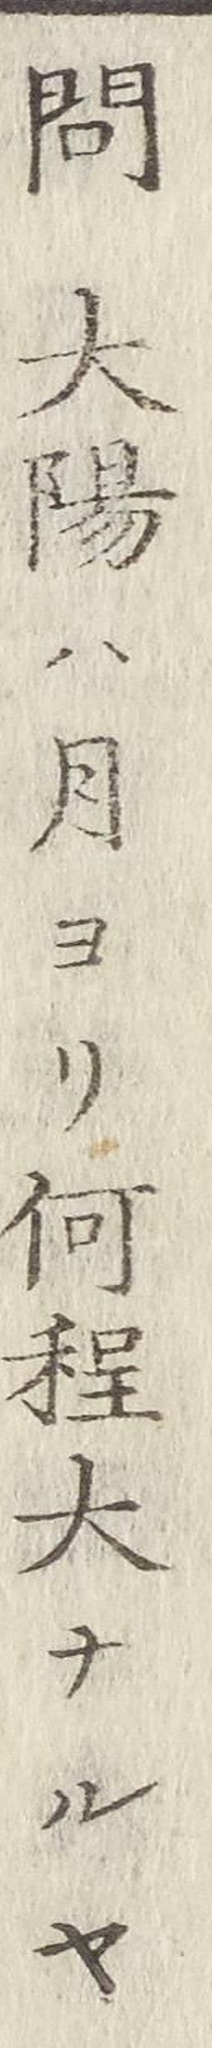問大陽ハ月ヨリ何程大ナルヤ
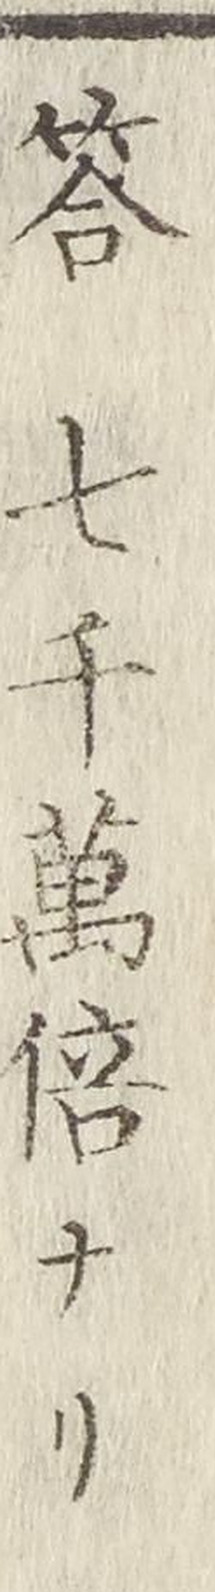答七千万倍ナリ
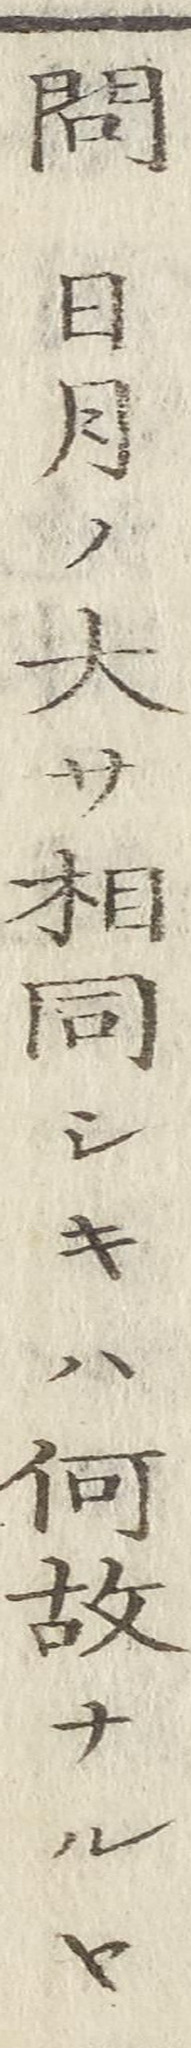問日月ノ大サ相同シキハ何故ナルヤ
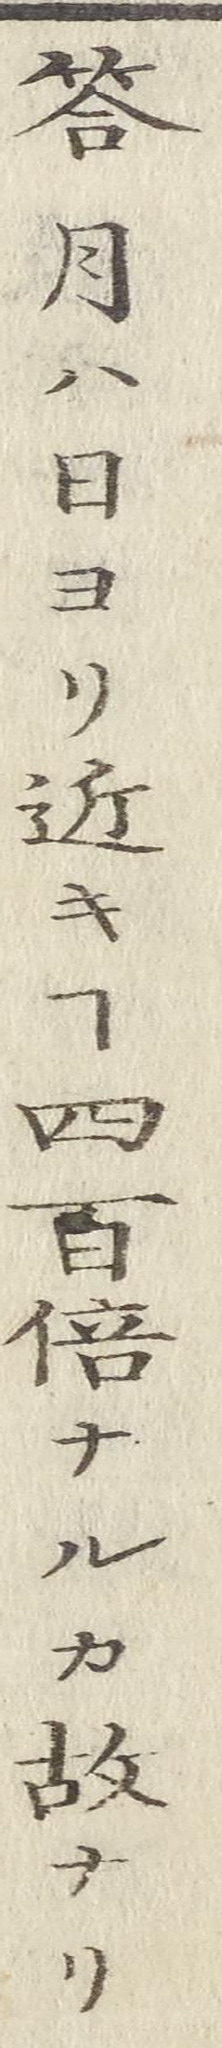答月ハ日ヨリ近キコト四百倍ナルカ故ナリ
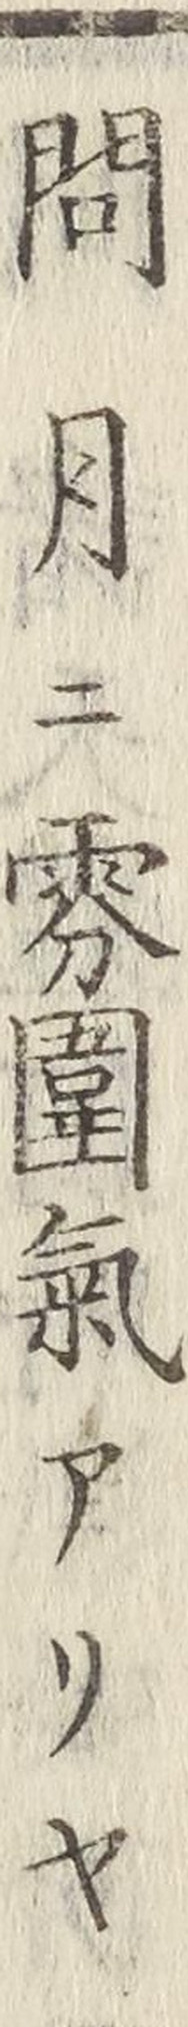問月ニ雰囲気アリヤ
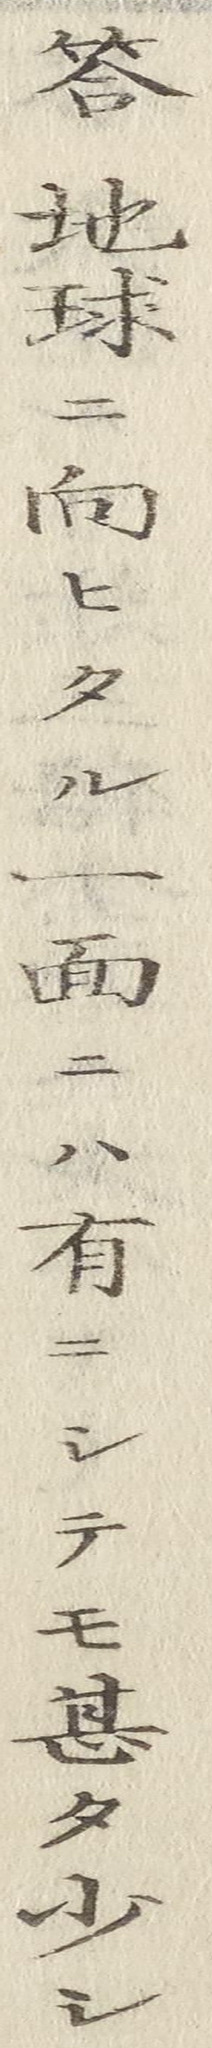答地球ニ向ヒタル一面ニハ有ニシテモ甚タ少シ
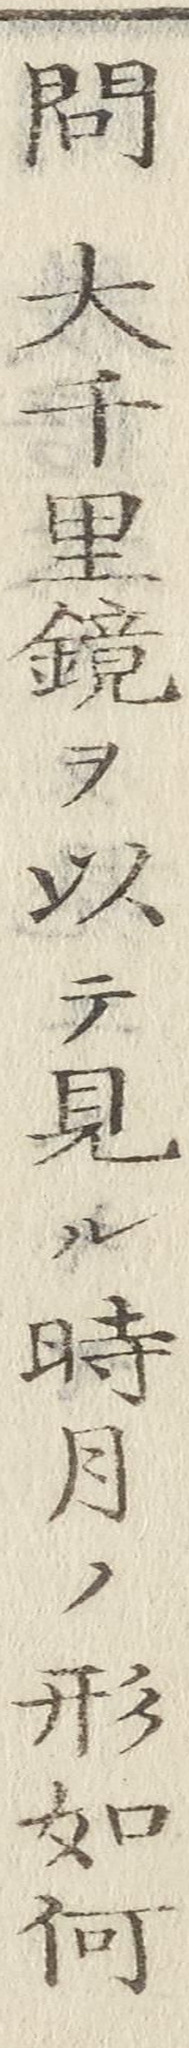問大千里鏡ヲ以テ見ル時月ノ形如何
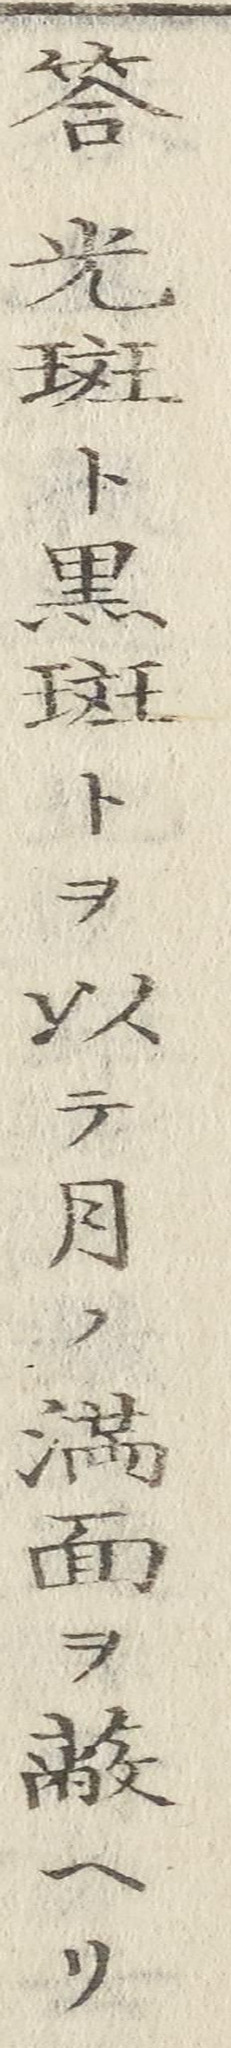答光斑ト黒斑トヲ以テ月ノ満面ヲ蔽ヘリ
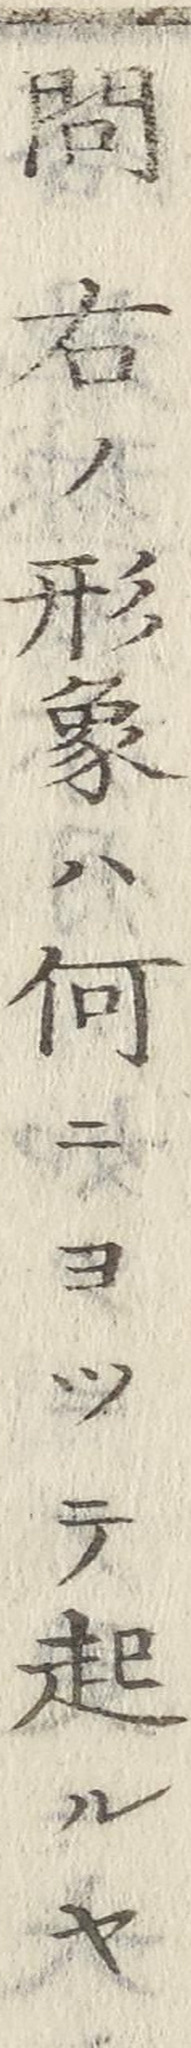問右ノ形象ハ何ニヨツテ起ルヤ
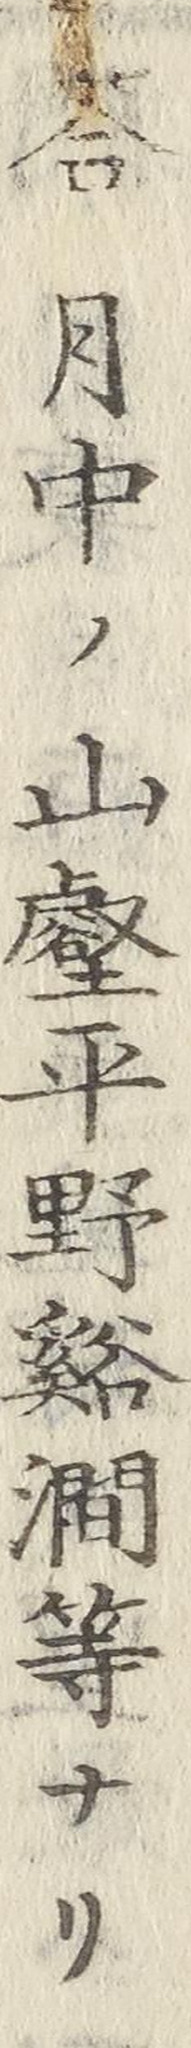答月中ノ山壑平野渓澗等ナリ
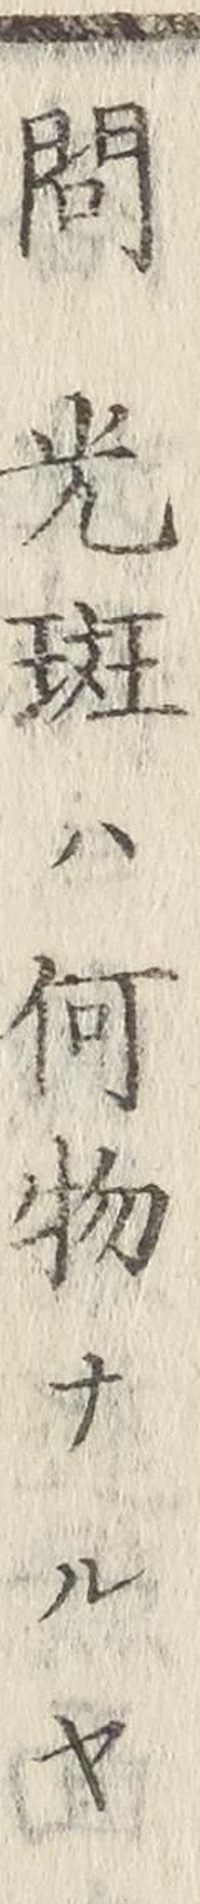問光斑ハ何物ナルヤ
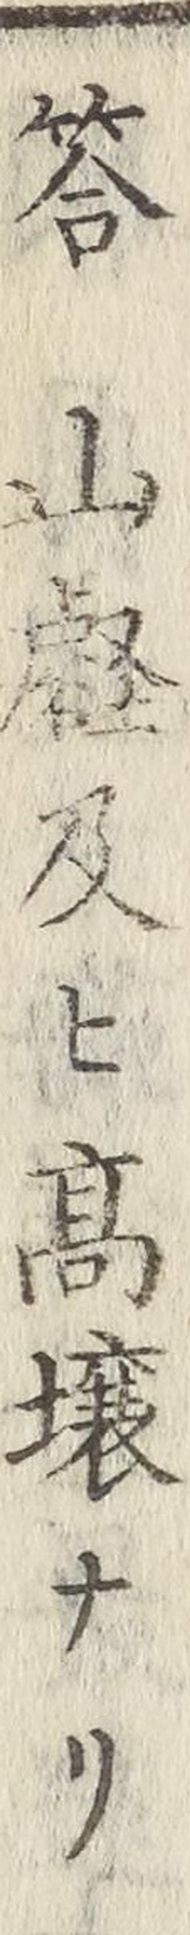答山壑及ヒ高壌ナリ
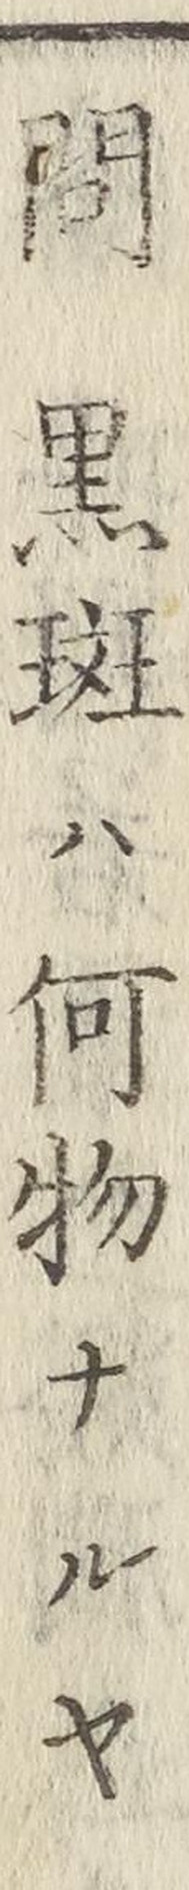問黒斑ハ何物ナルヤ

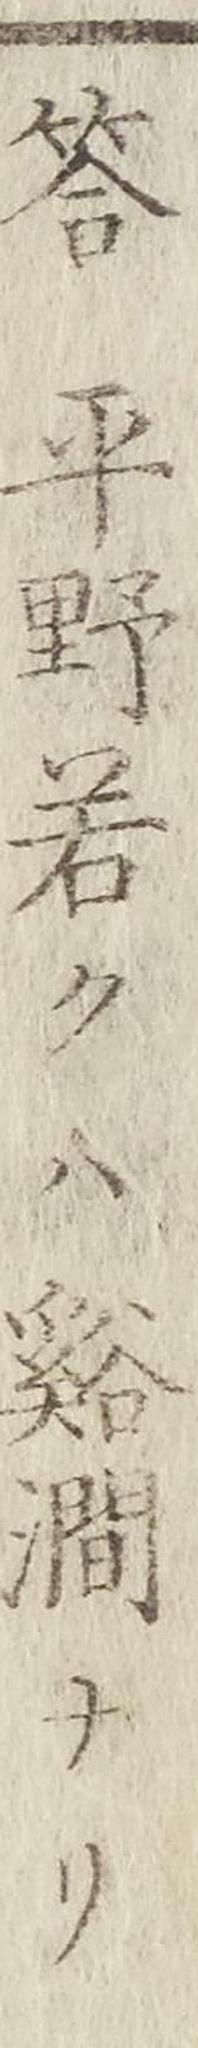答平野若クハ渓澗ナリ
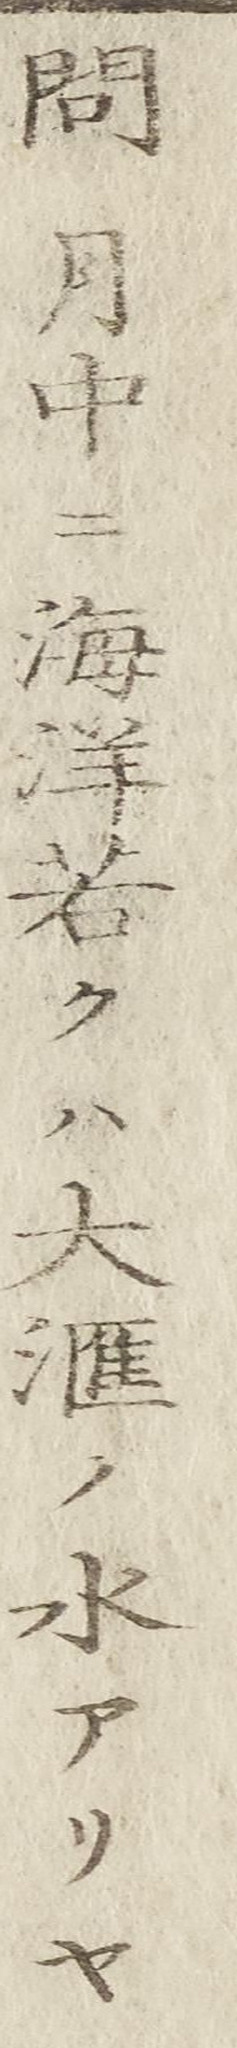問月中ニ海洋若クハ大滙ノ水アリヤ
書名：星学圖説　下
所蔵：東京大学地震研究所図書室 Earthquake Research Institute Library, The University of Tokyo, JAPAN
